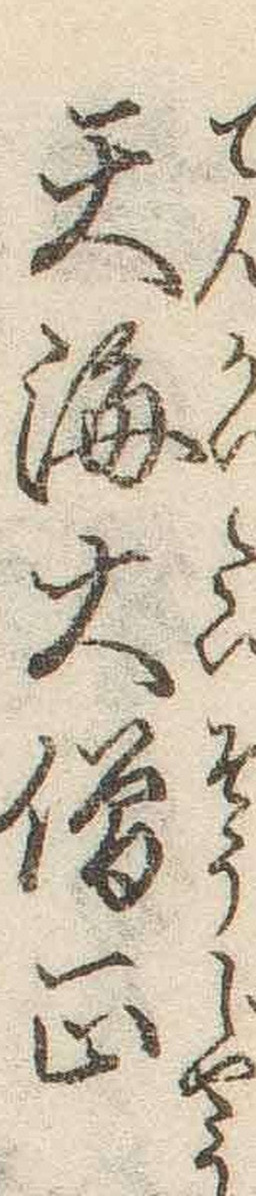天海大僧正
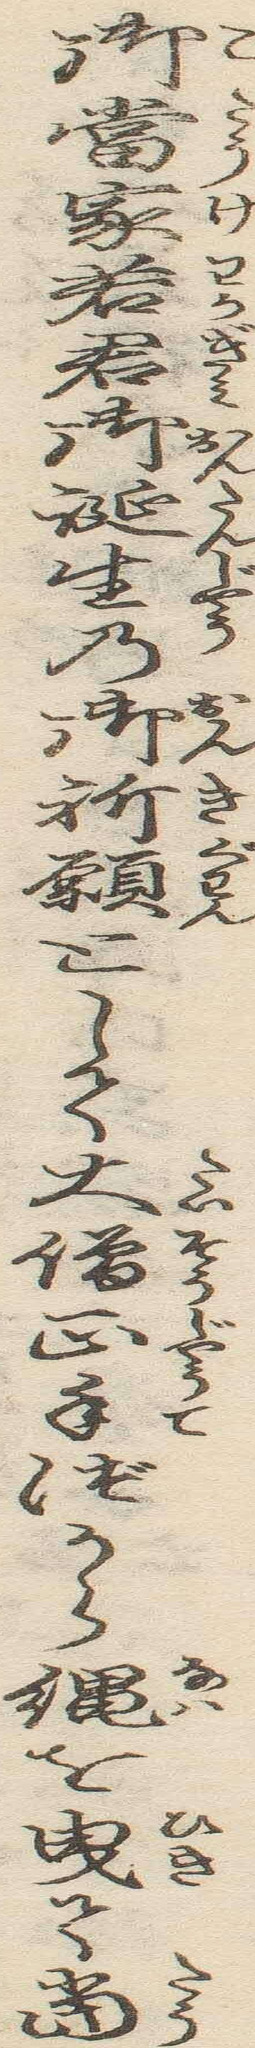御當家若君御誕生の御祈願として大僧正手づから縄を曳て當

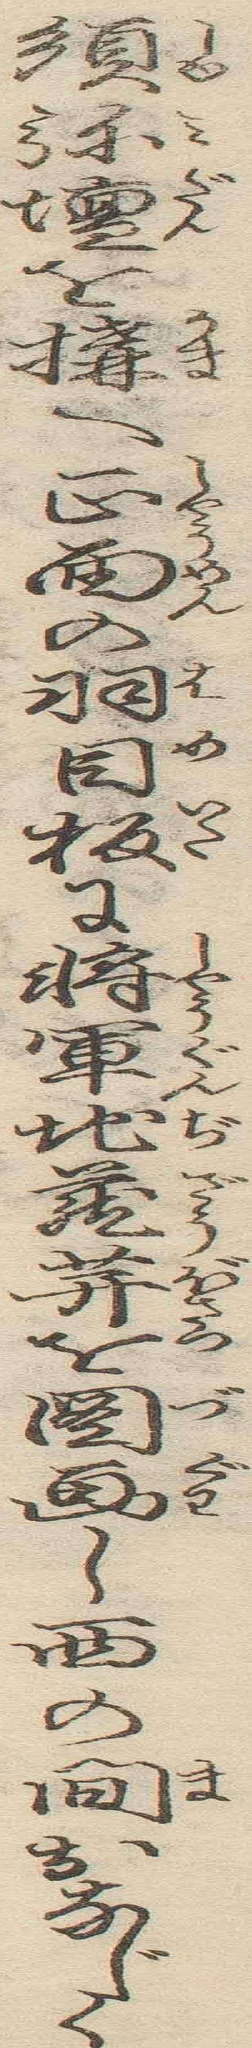須弥壇を構へ正面の羽目板に將軍地蔵茾を圖画し西の間おなじく
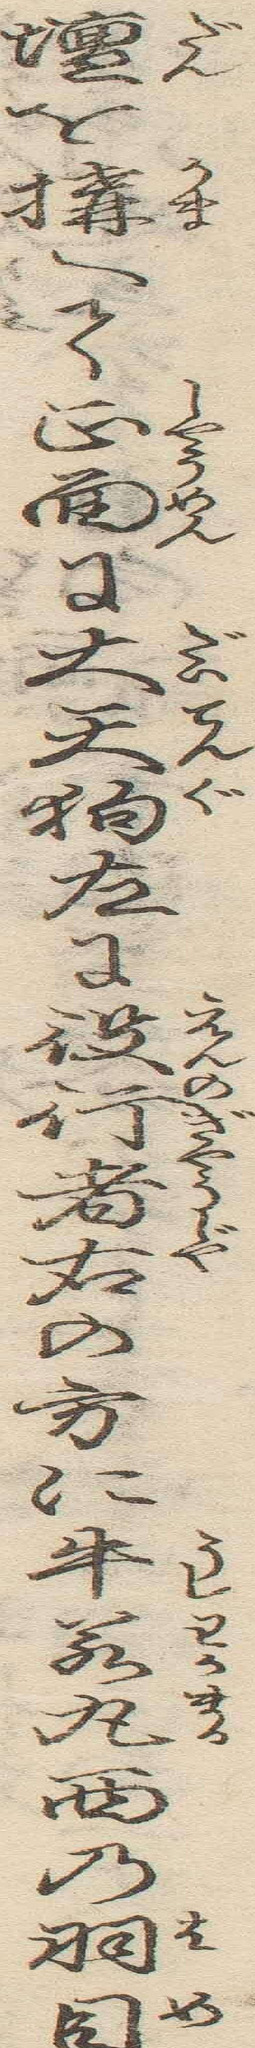壇を構へて正面に大天狗左に役行者右の方に牛若丸西の羽目
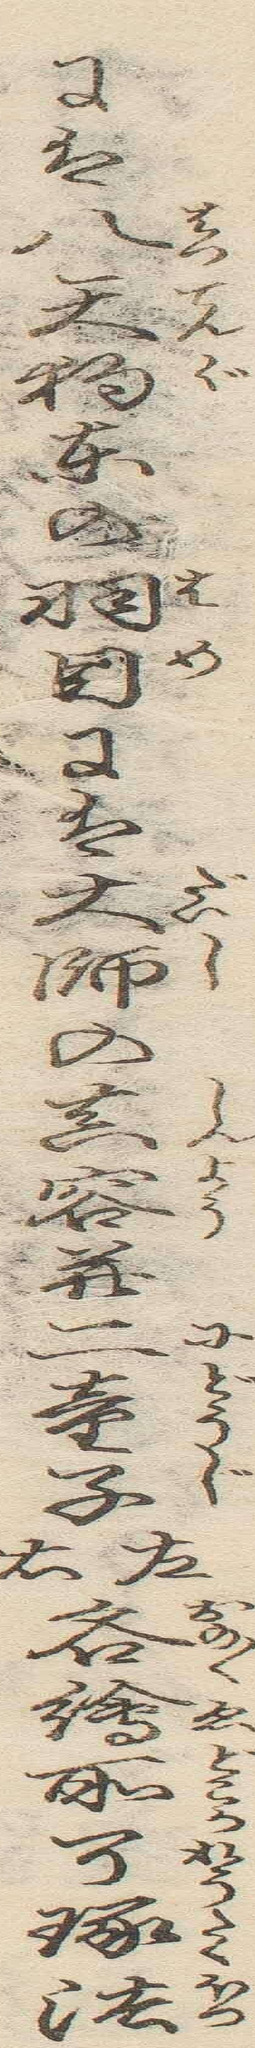には八天狗東の羽目には大師の真容并二童子左右各繪所了琢法
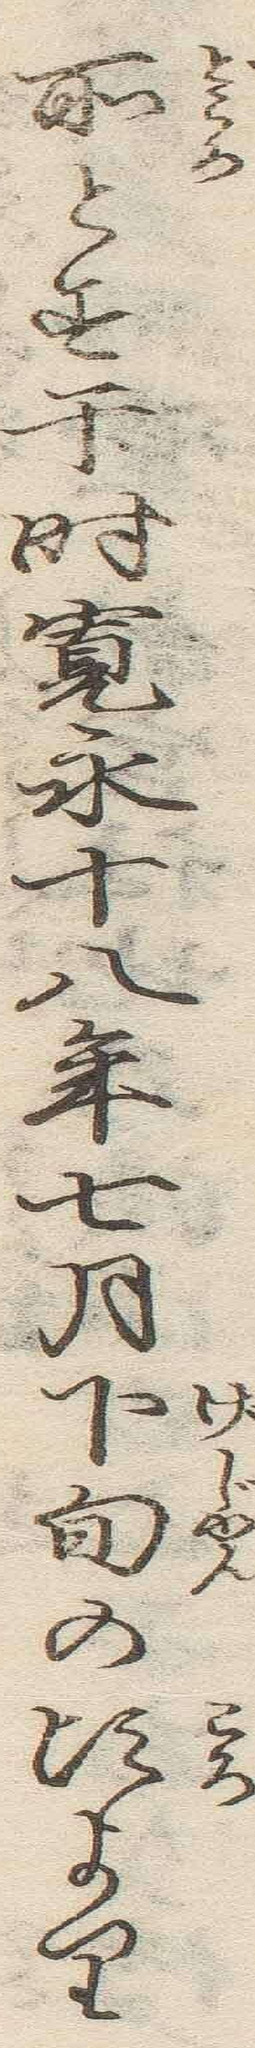所とす于时寛永十八年七月下旬の頃より
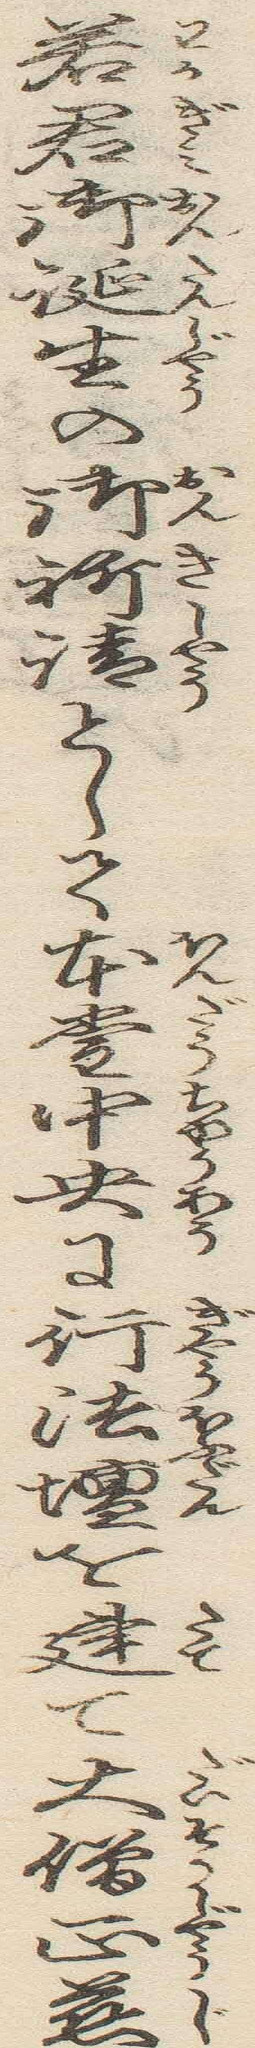若君御誕生の御祈請として本堂中央に行法壇を建て大僧正慈
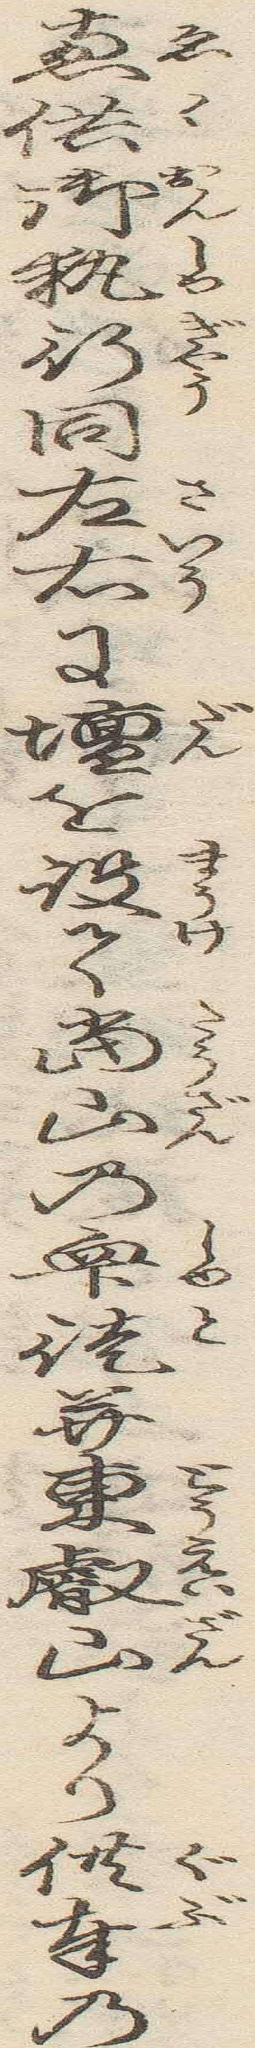恵供御執行同左右に壇を設て當山の衆徒并東叡山より供奉の
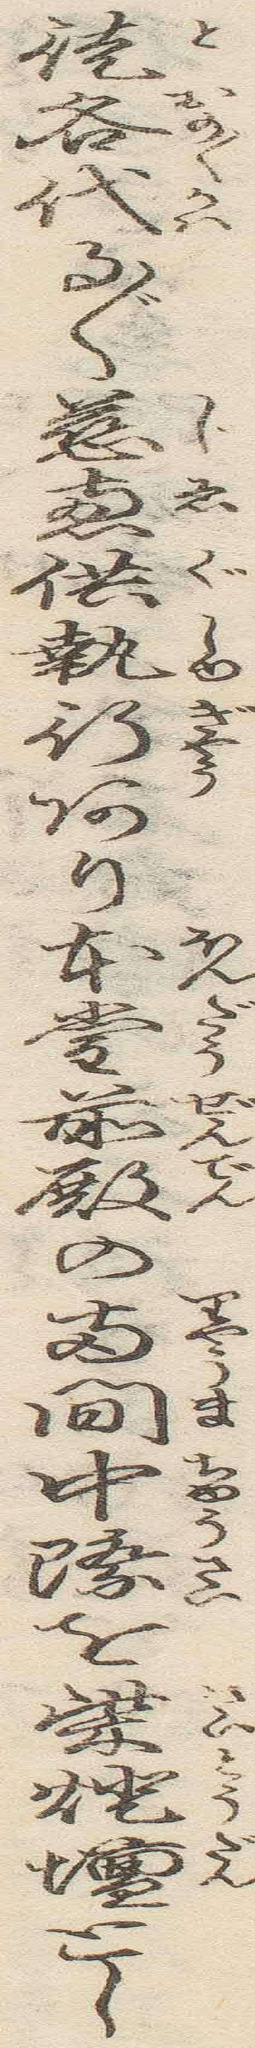徒各代る〴〵慈恵供執行あり本堂前殿の両間中際を柴燈壇とし
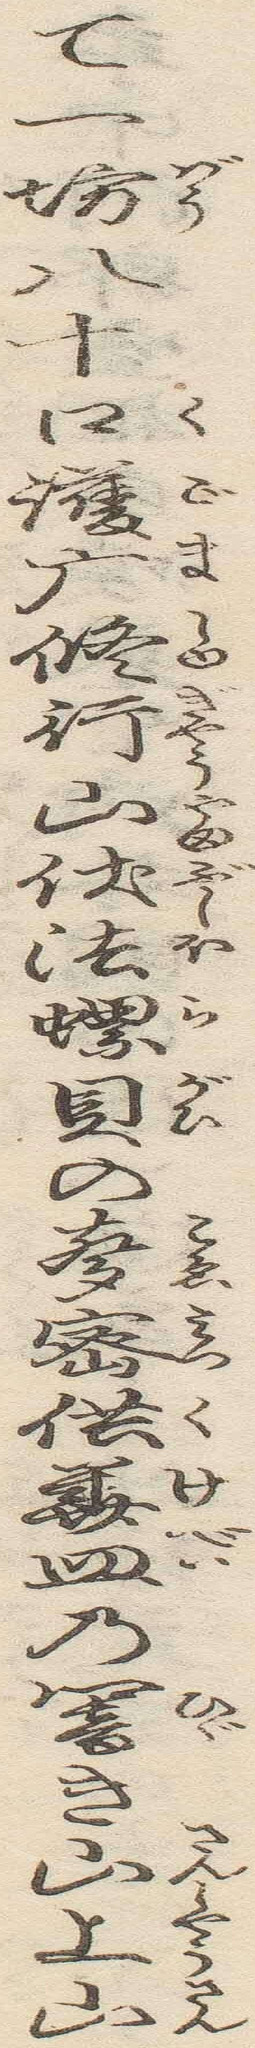て一坊八十口護广修行山伏法螺貝の聲密供養皿の響き三上山
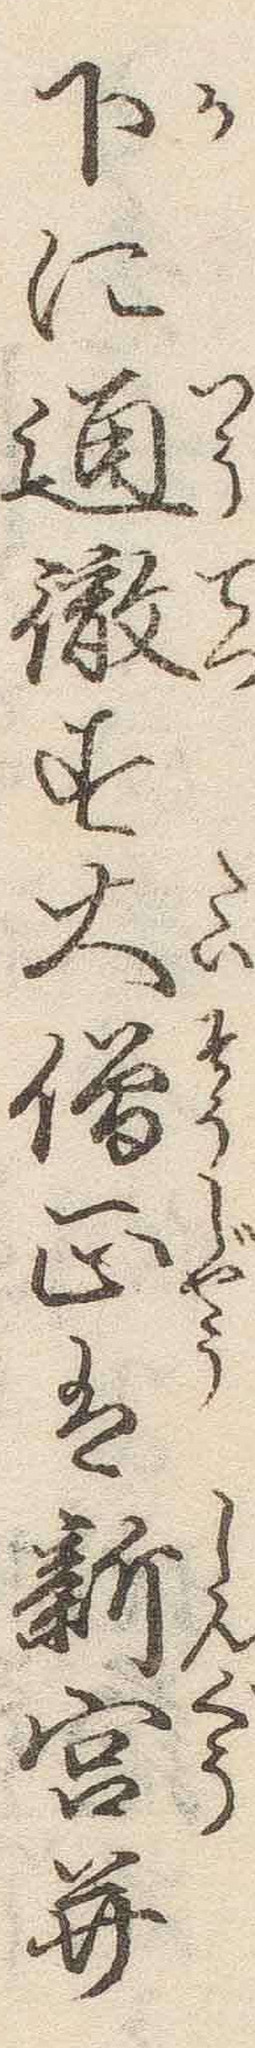下に通徹す大僧正は新宮并
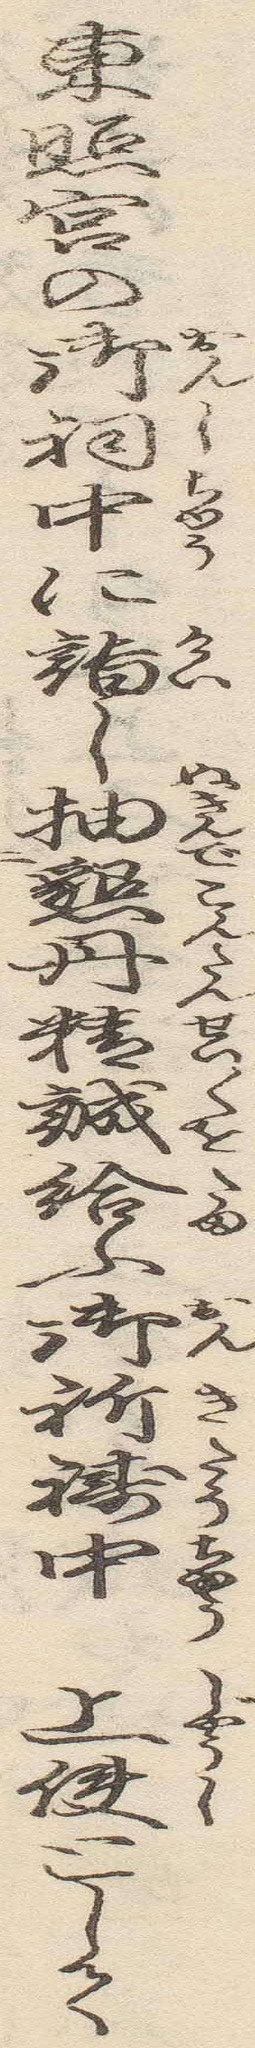東照宮の御祠中に詣し抽懇丹精誠給ふ御祈祷中上使として
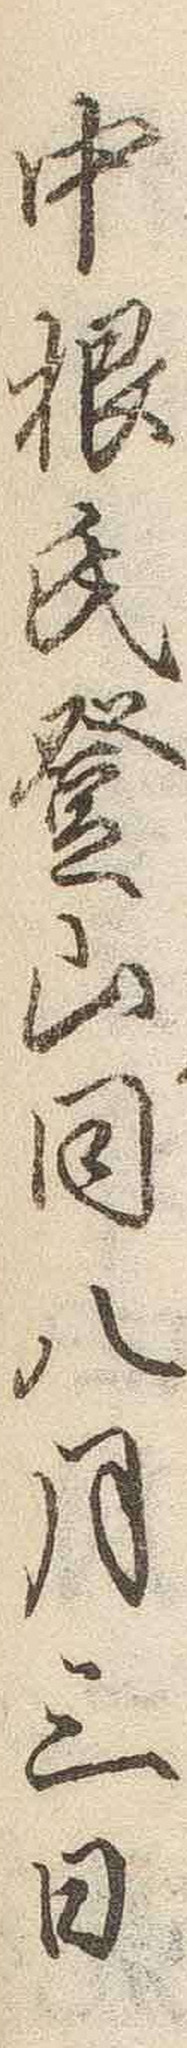中根氏登山同八月三日
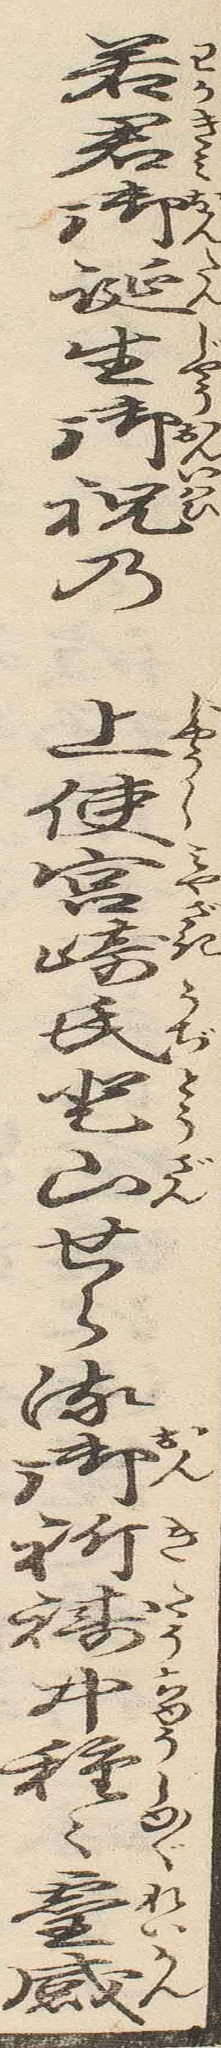若君御誕生御祝の上使宮崎氏登山せらる御祈祷中種〻靈感
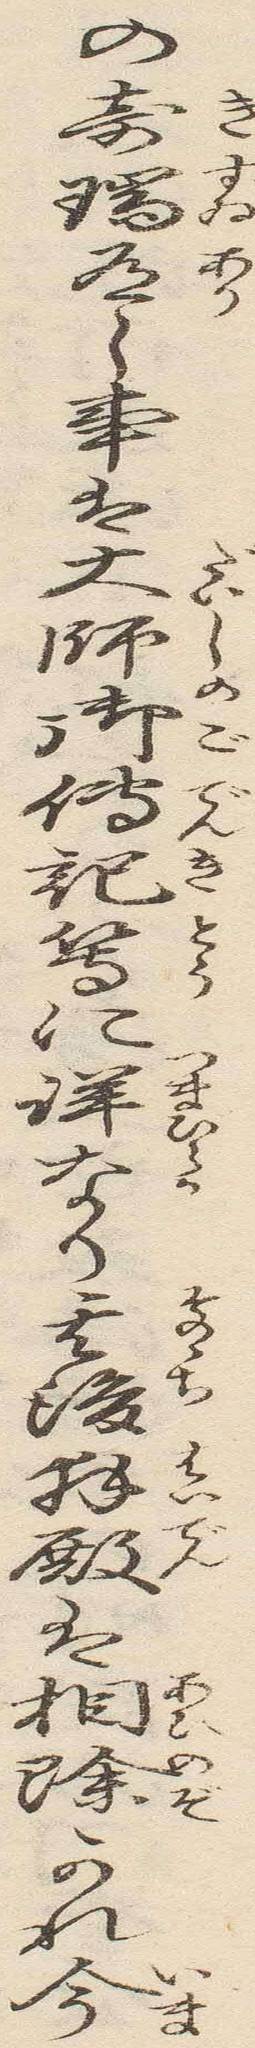の竒瑞有し事は大師御傳記等に詳なり其後拜殿は相除かれ今
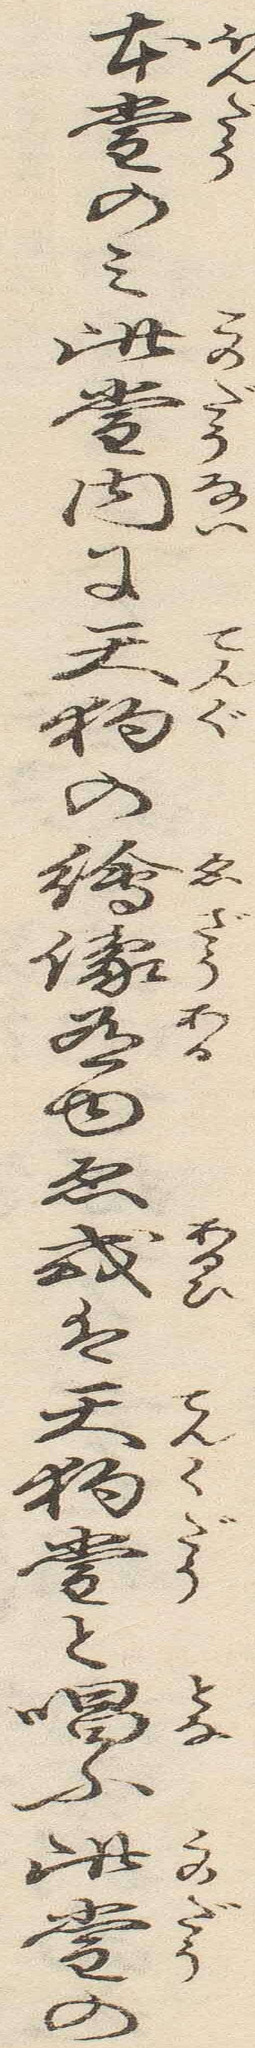本堂のみ此堂内に天狗の繪像有ゆゑ或は天狗堂と唱ふ此堂の
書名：日光山志
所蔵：東京学芸大学附属図書館 国文学研究資料館
